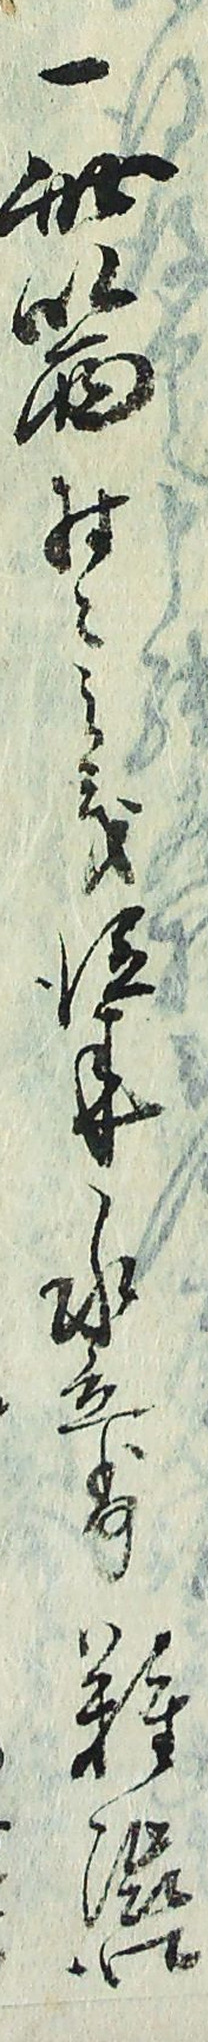一此以西村々之義従来水立寄難渋仕
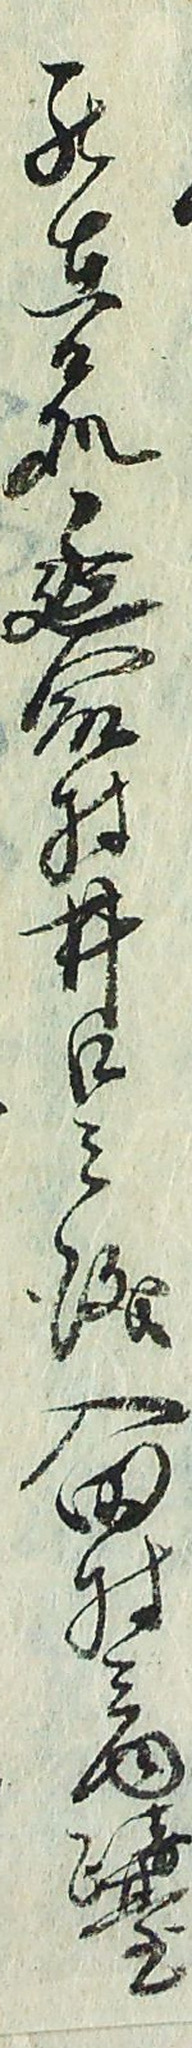罷在候処延命村井口之儀入田村之内崎臺
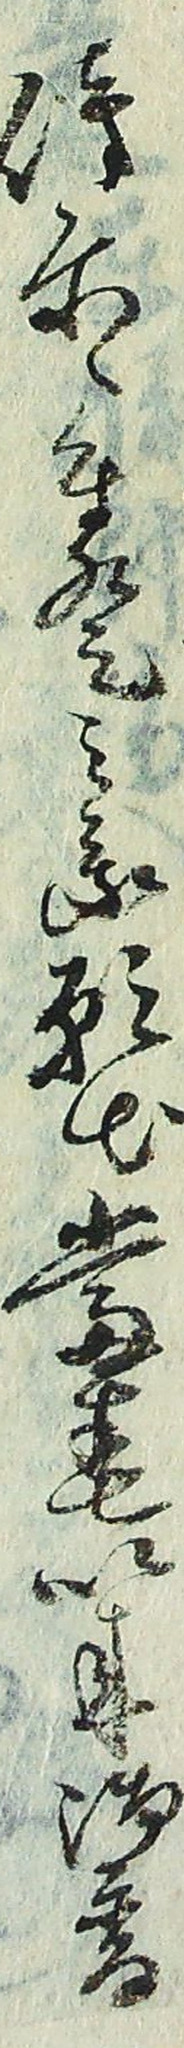傍示へ付登之義願出當春以来御普
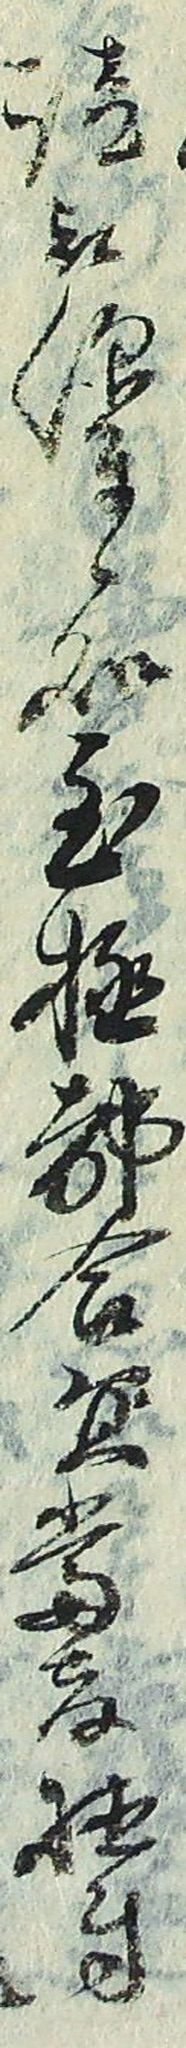請被仰付候処至極都合宜當夏植付
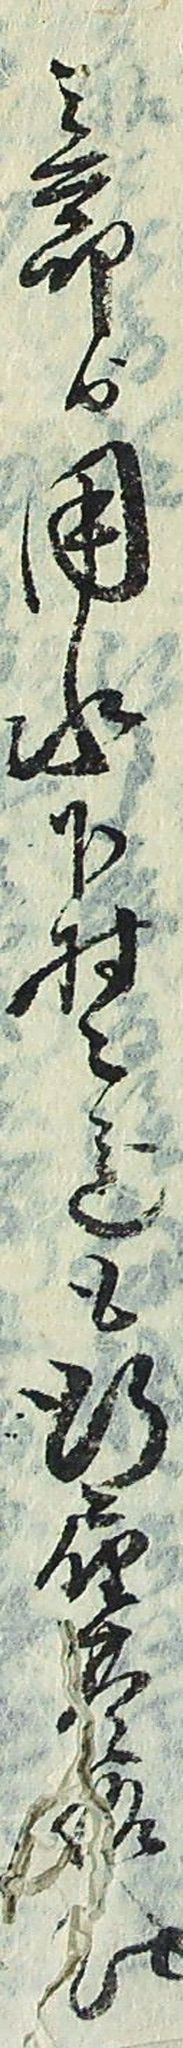之節ゟ用水下村々迄も行届豊作仕
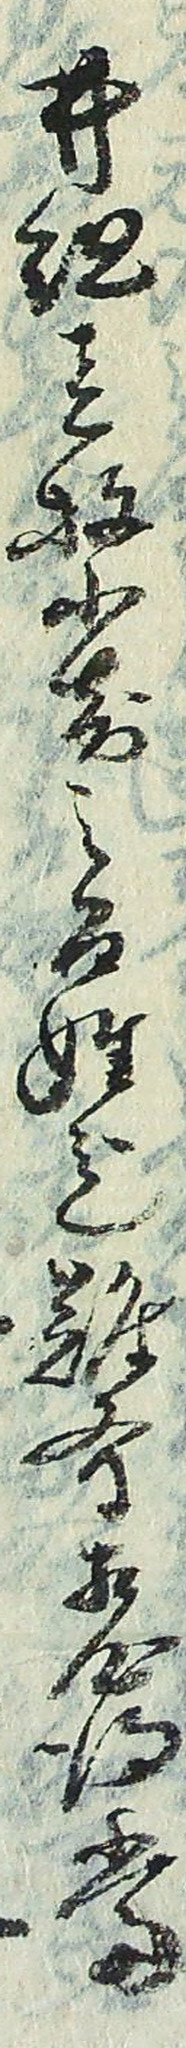井組壱牧小前之百姓迄難有相心得當
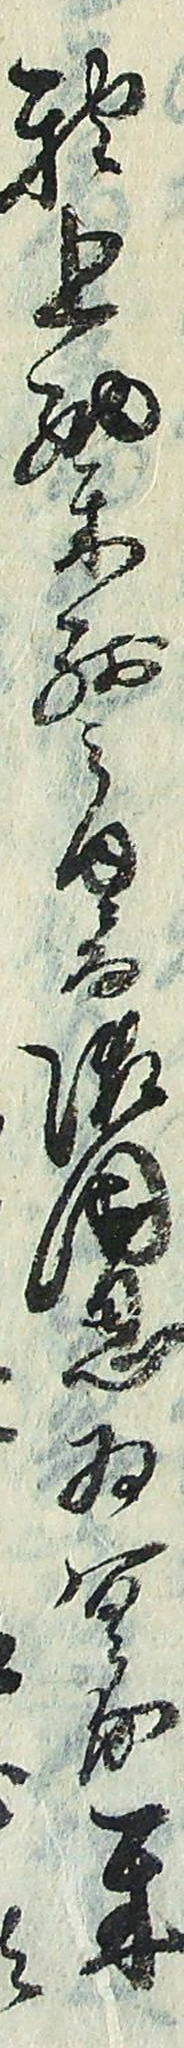秋上納米残之内ニ而御国恩為冥加米
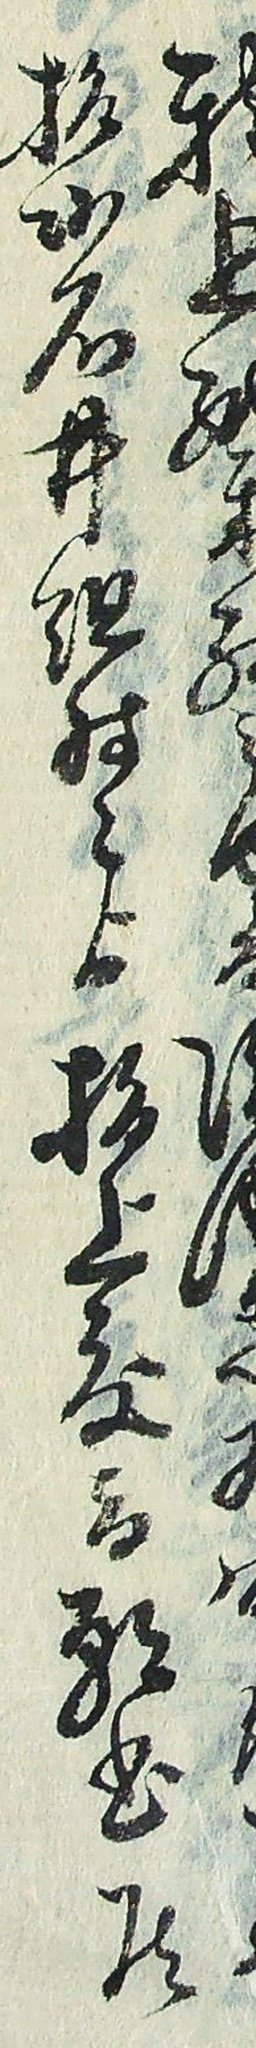拾弐石井組村々ゟ指上度旨願出候

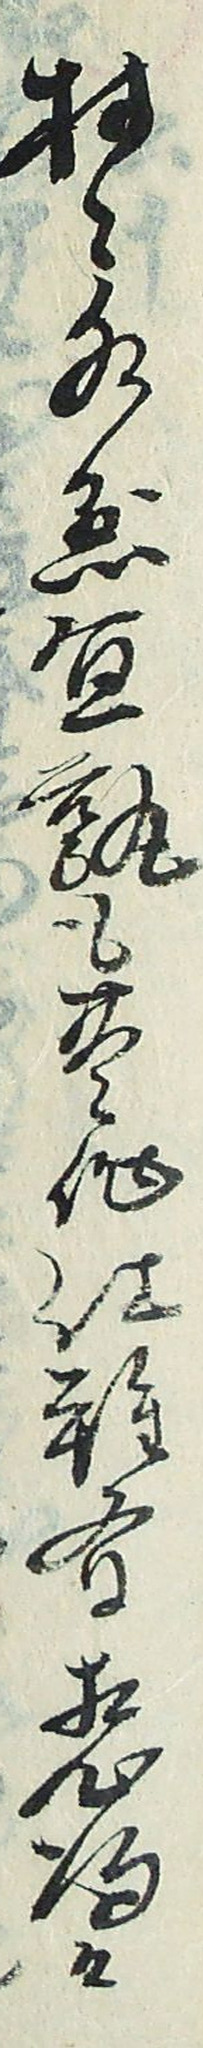村々水懸宜孰も豊作仕難有相心得候
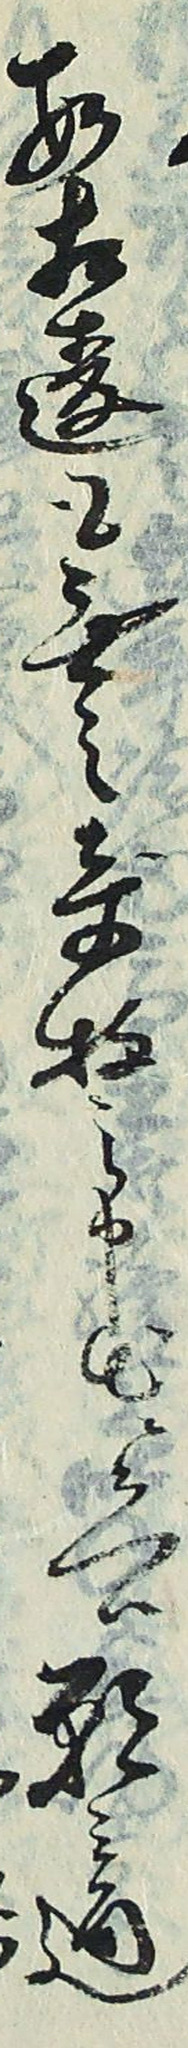段相違も無之壱牧之申出ニ候へハ願之通
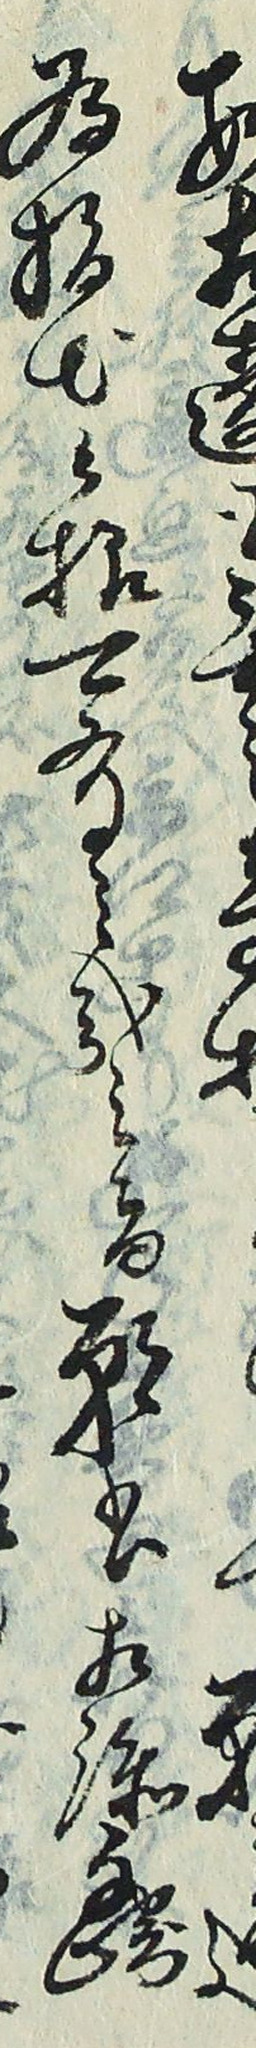為指出候様可有之哉之旨願書相添手崎
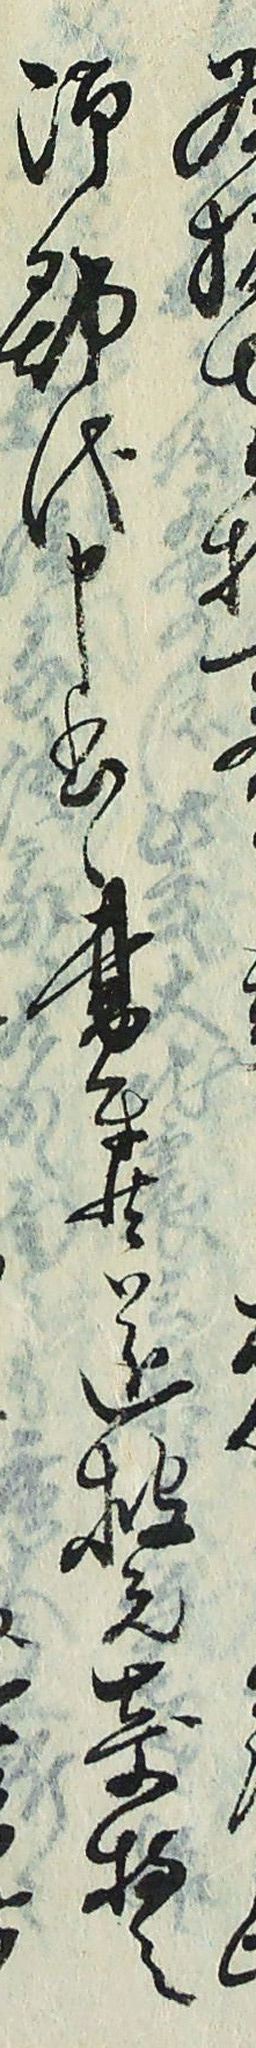御郡代申出候書付共遂披見寄持之
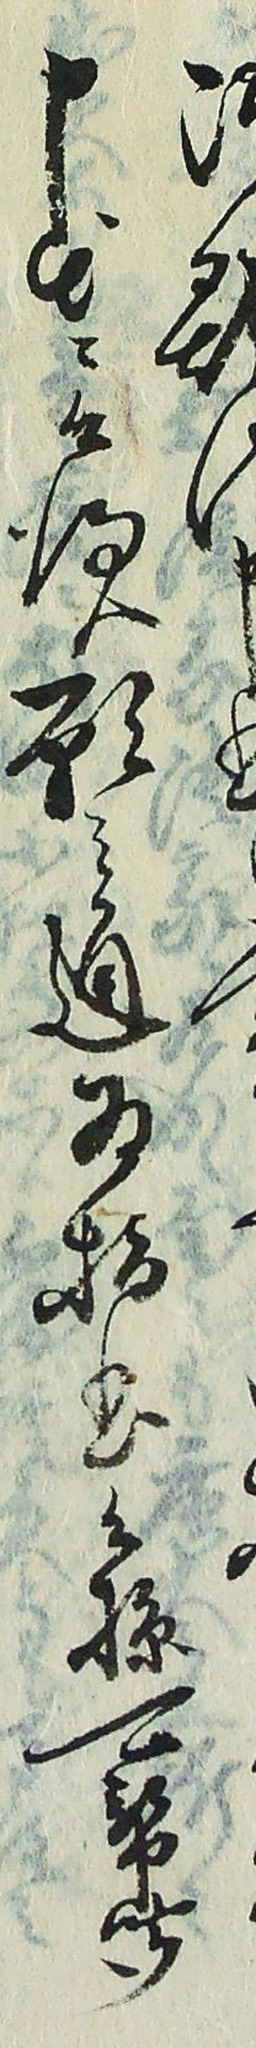申出ニ候得ハ願之通為指出候様可被申聞
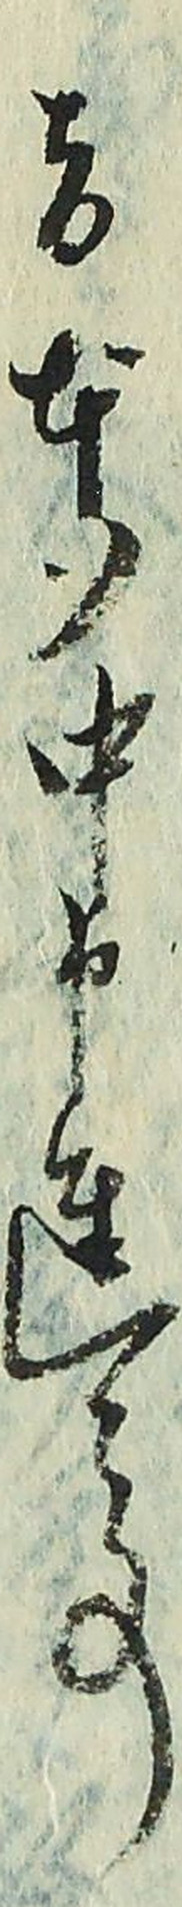旨本〆中申達候事
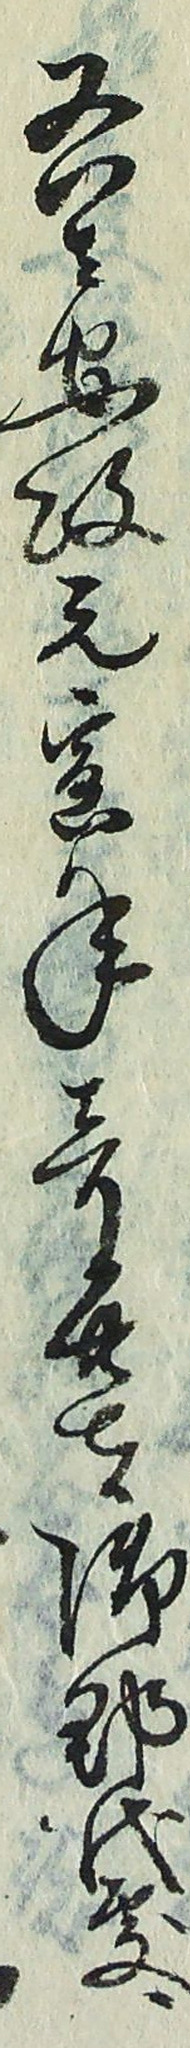右者安政元寅年十二月廿七日御郡代處ニ
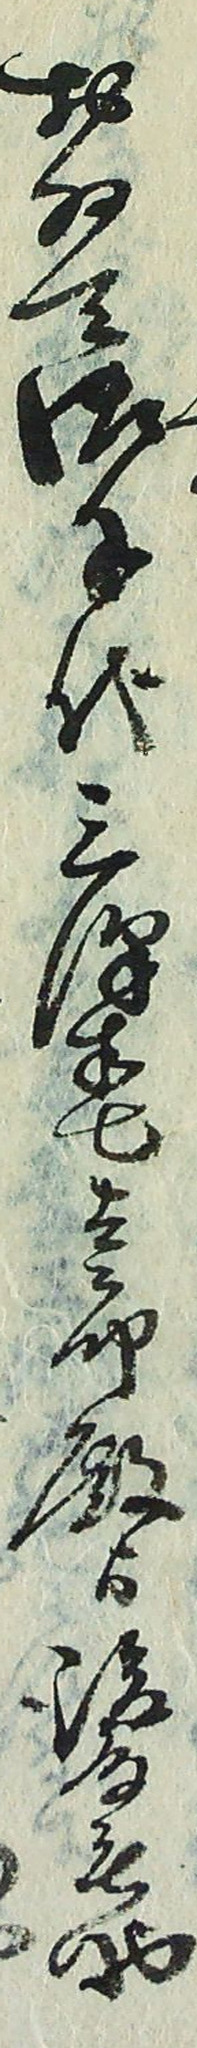おゐて御郡代三澤春太郎殿ゟ後藤庄助
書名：諸御趣意書并御下知向之写
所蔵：鳴門教育大学 Naruto University of Education
